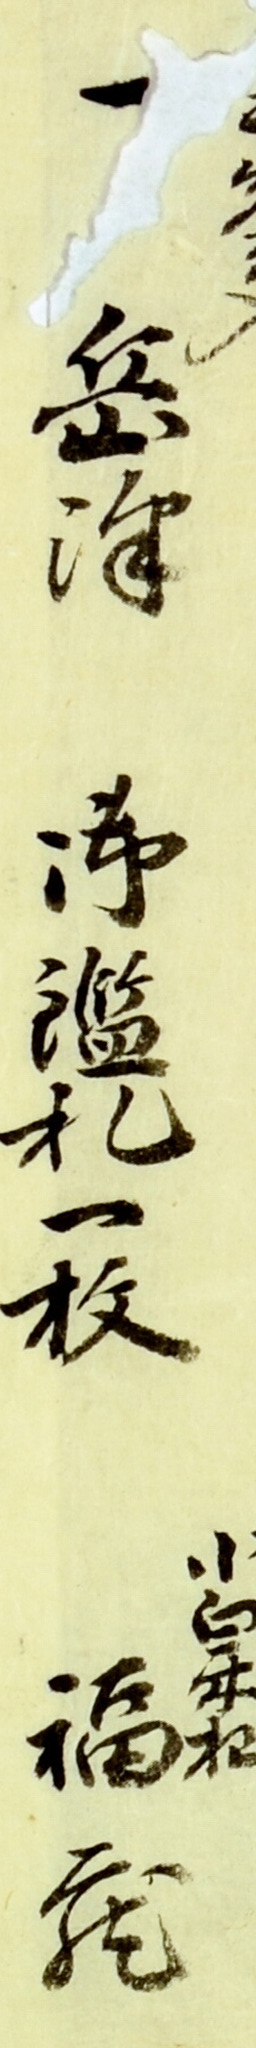一岳沢御鑑札一枚福蔵

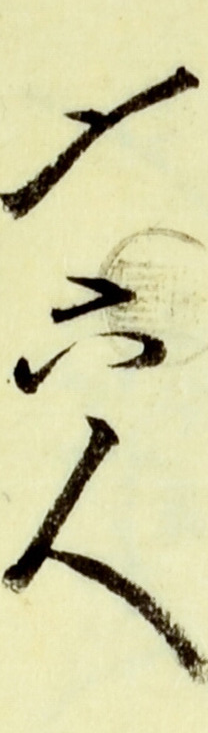〆六人
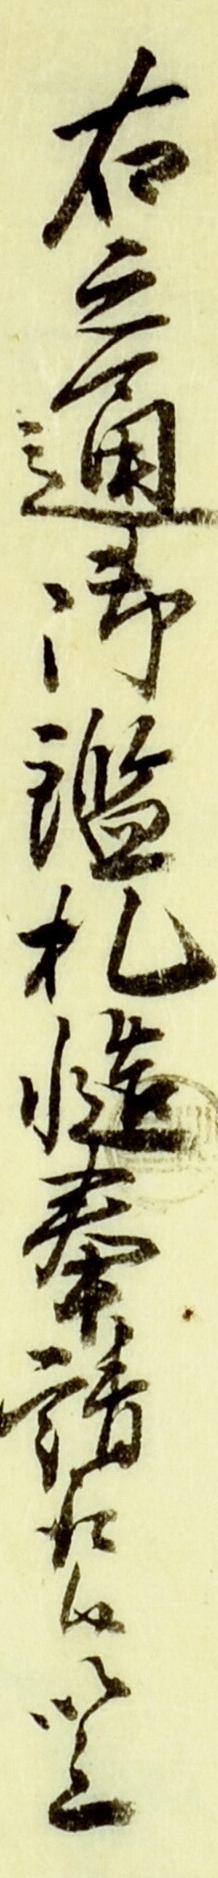右之通御鑑札慥奉請取候以上
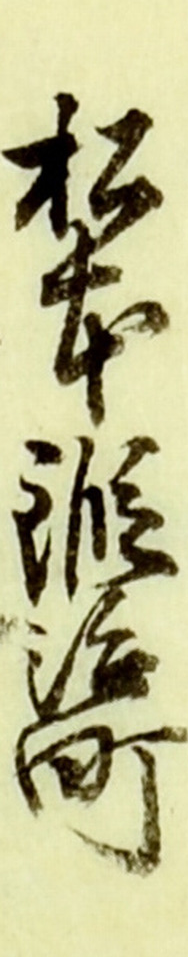松本鍛冶町

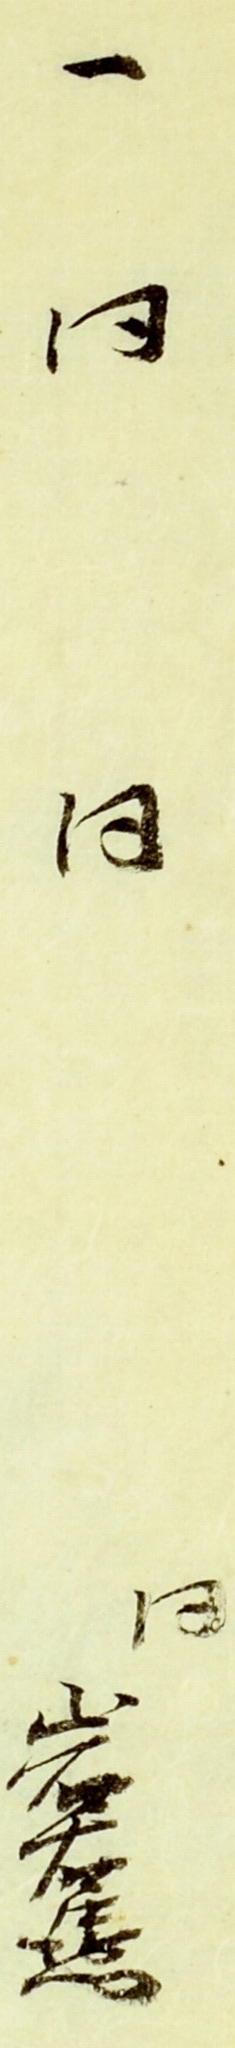一同同同芳右衛門
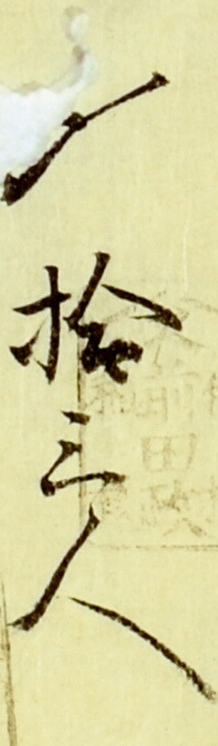〆拾三人
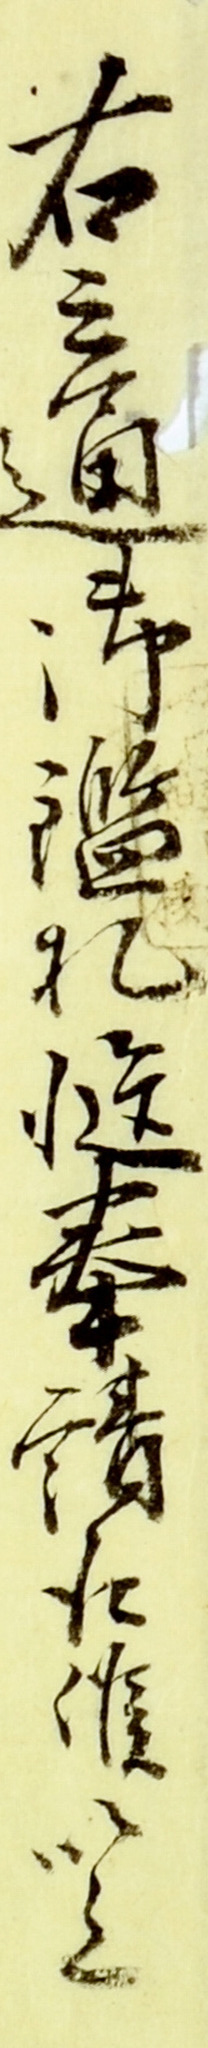右之通御鑑札慥奉請取候以上

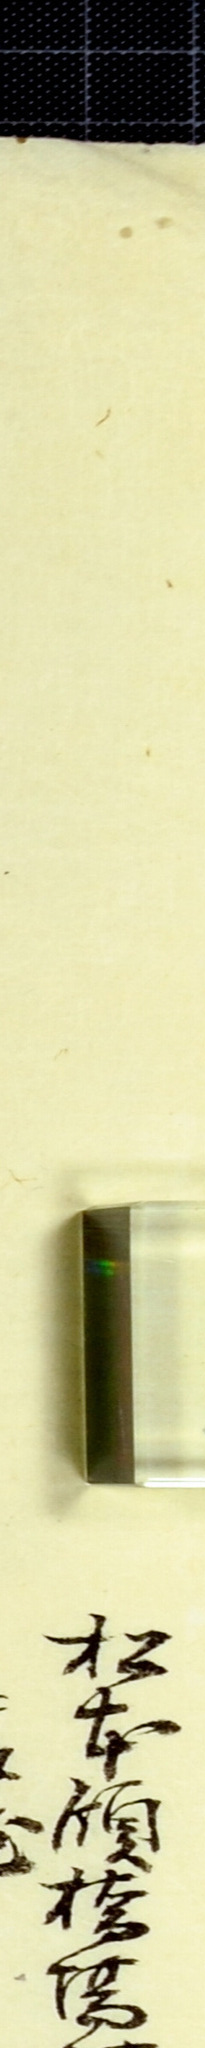松本領橋場村
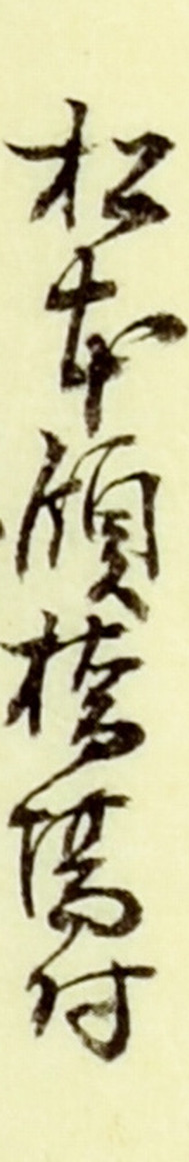松本領橋場村
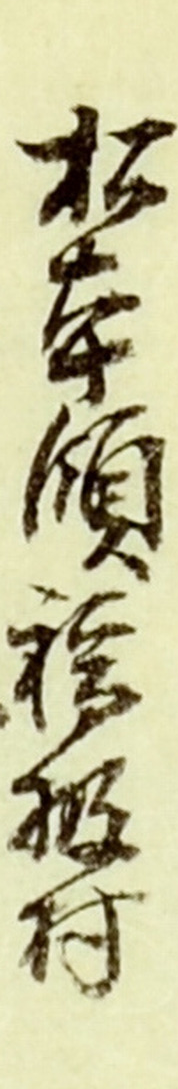松本領橋場村
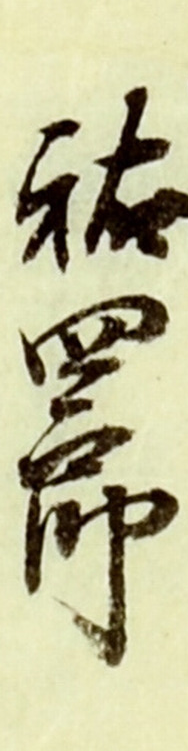祐四郎
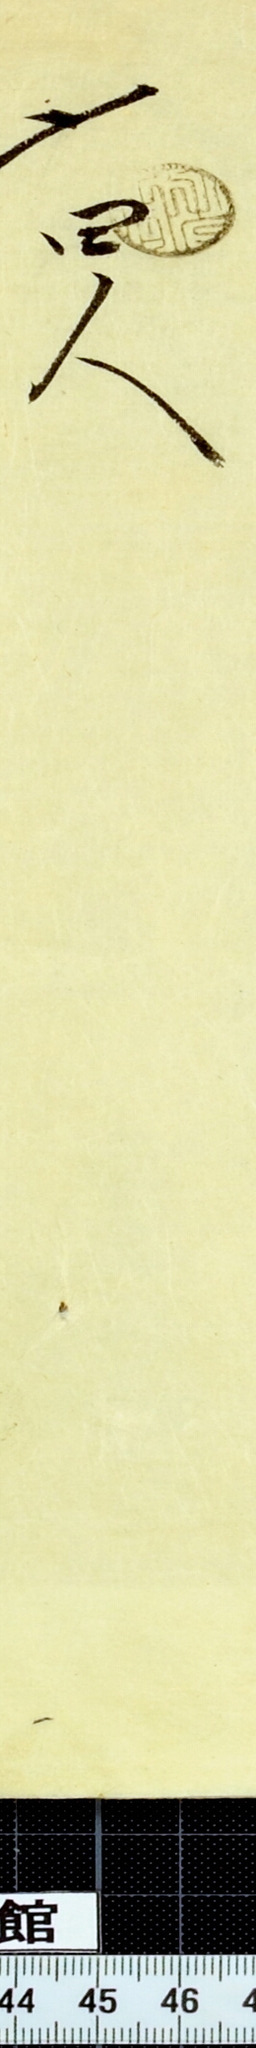〆四人
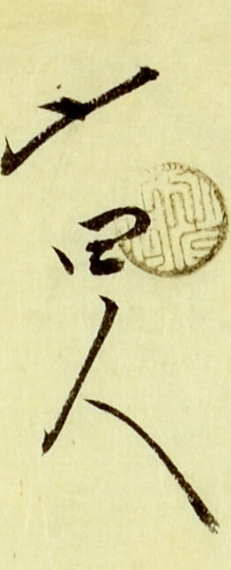〆四人
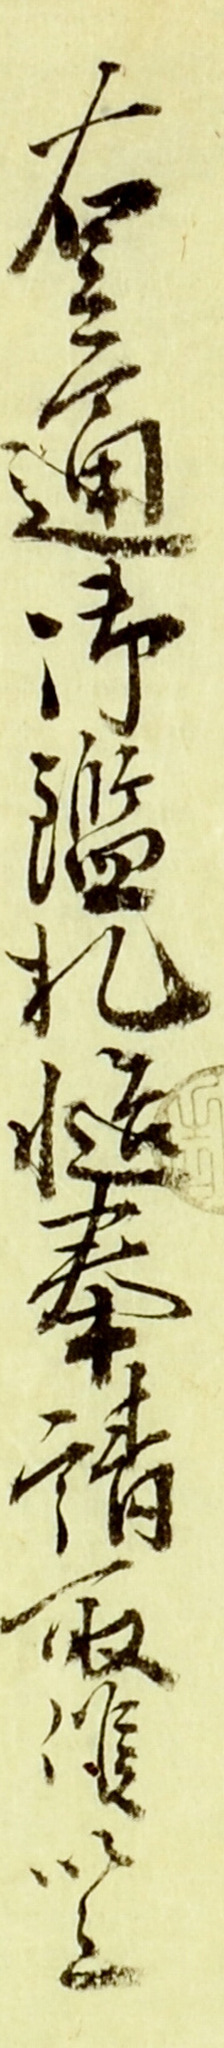右之通御鑑札慥奉請取候以上
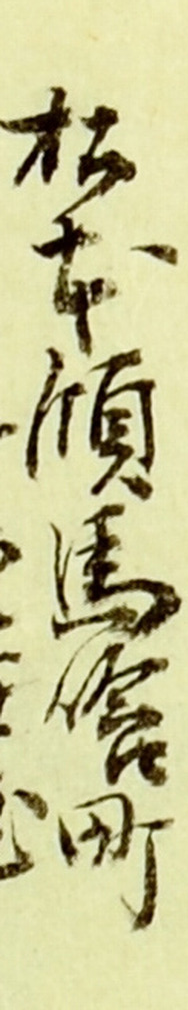松本領馬喰町
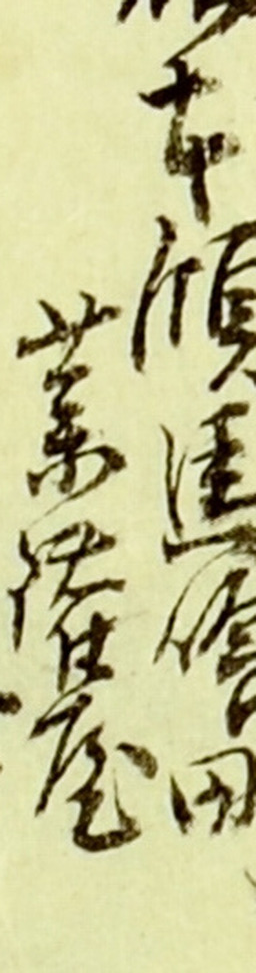薬鑵屋
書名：小白木條目請書并判取帳
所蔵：伊那市立高遠町図書館・合同会社AMANE
